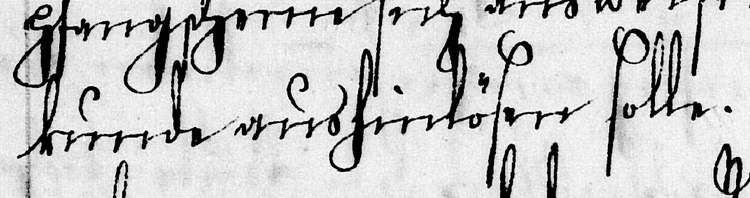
kunde aushinlösen soll¬
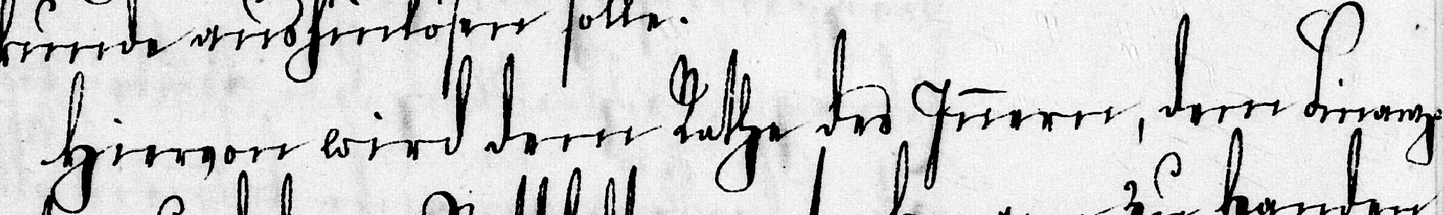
Hiervon wird dem Rathe des Innern, dem Finan¬
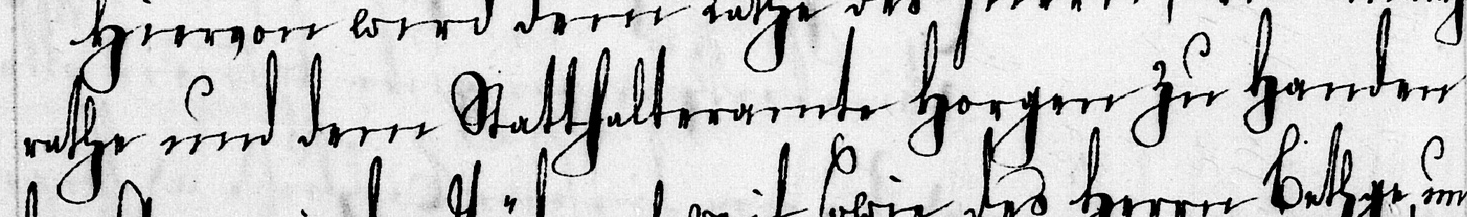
rathe und dem Statthalteramte Horgen zu Handen
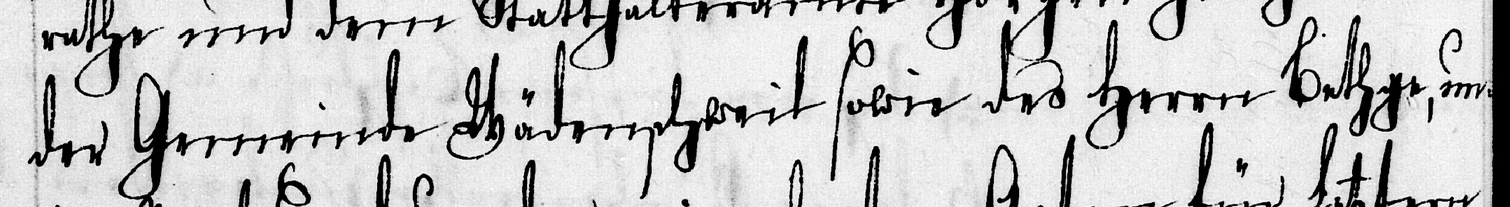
der Gemeinde Wädenschweil sowie des Herrn Bethge, u¬
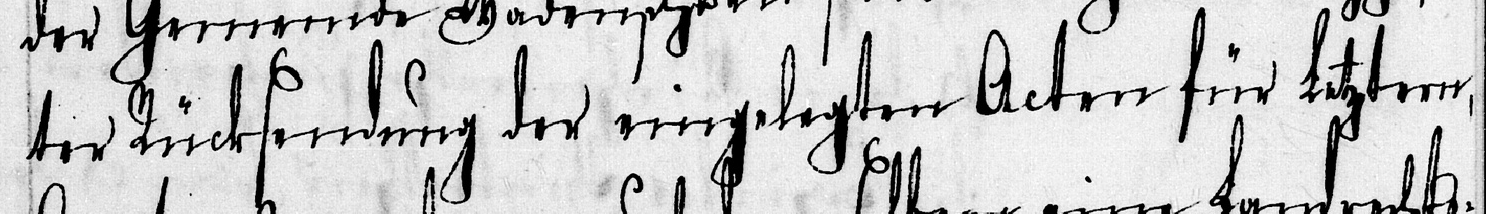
nter Rücksendung der eingelegten Acten für Letztern,
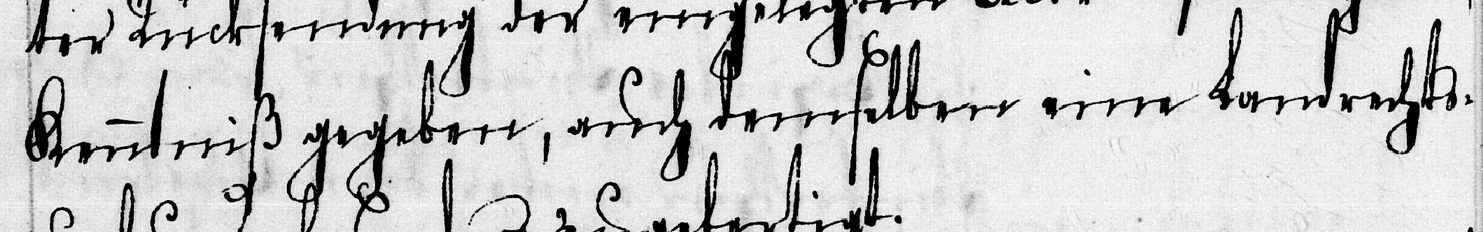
Kenntniß gegeben, auch demselben eine Landrechts¬
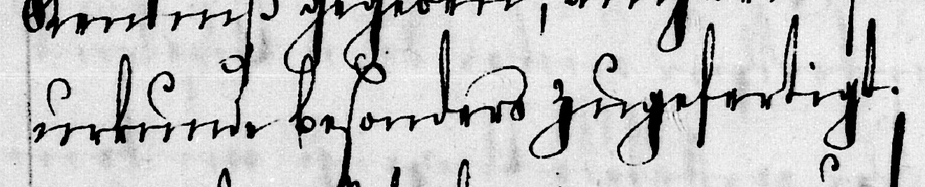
urkunde besonders zugefertigt.
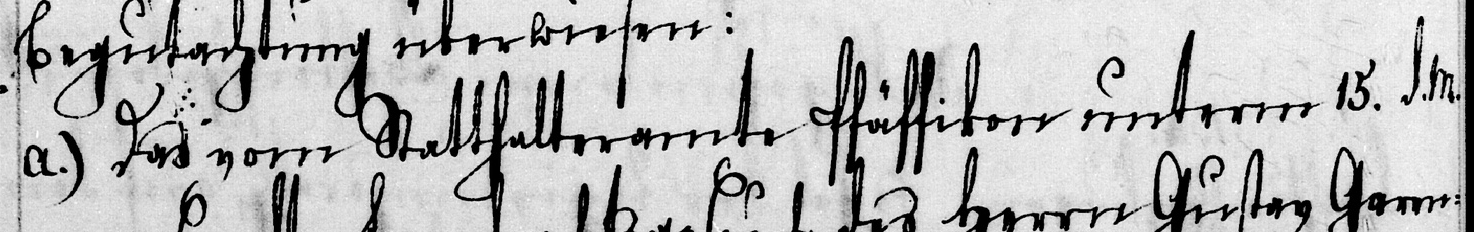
a.) Das vom Statthalteramte Pfäffikon unterm 15. d.
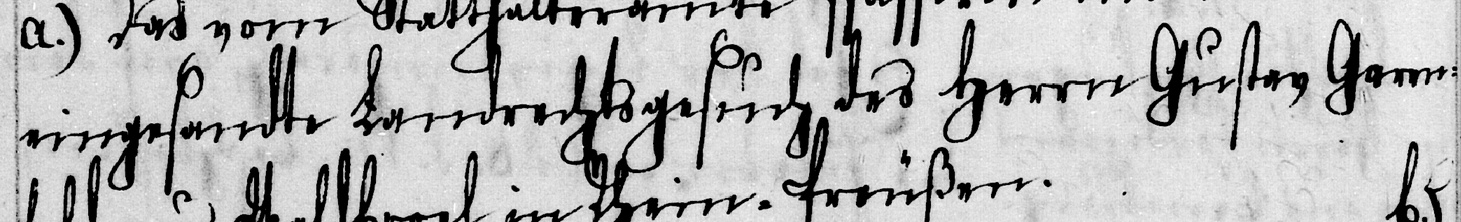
eingesandte Landrechtsgesuch des Herrn Gustav Gare¬
